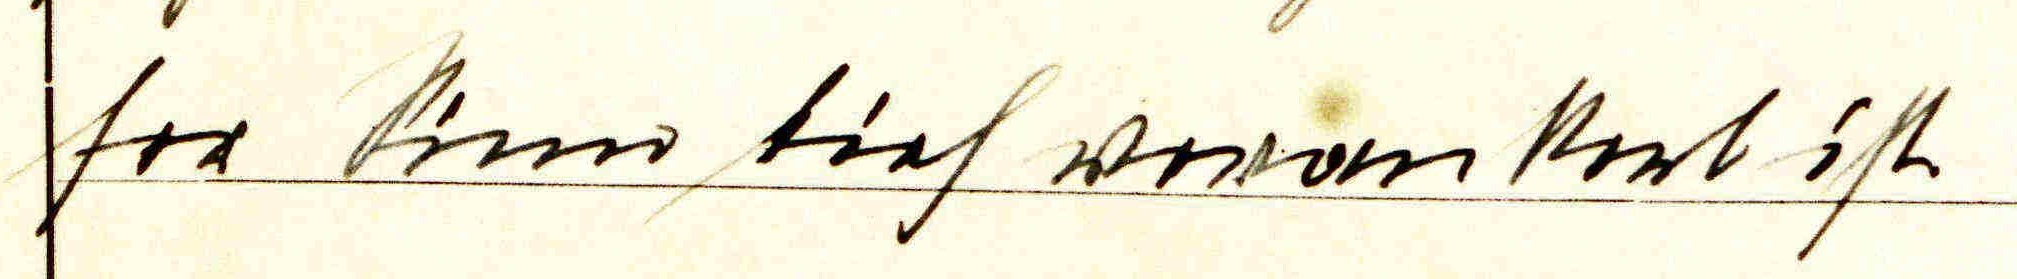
ser Sich tief verankert ist.
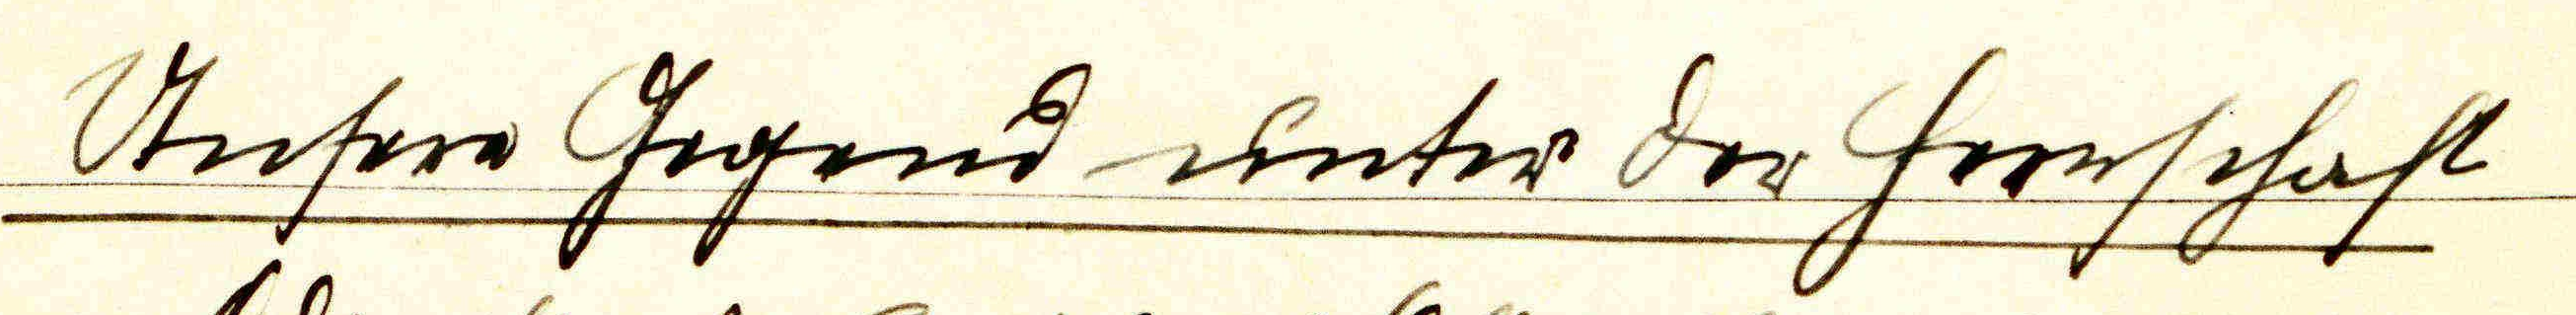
Unsere Gegend unter der Herrschaft
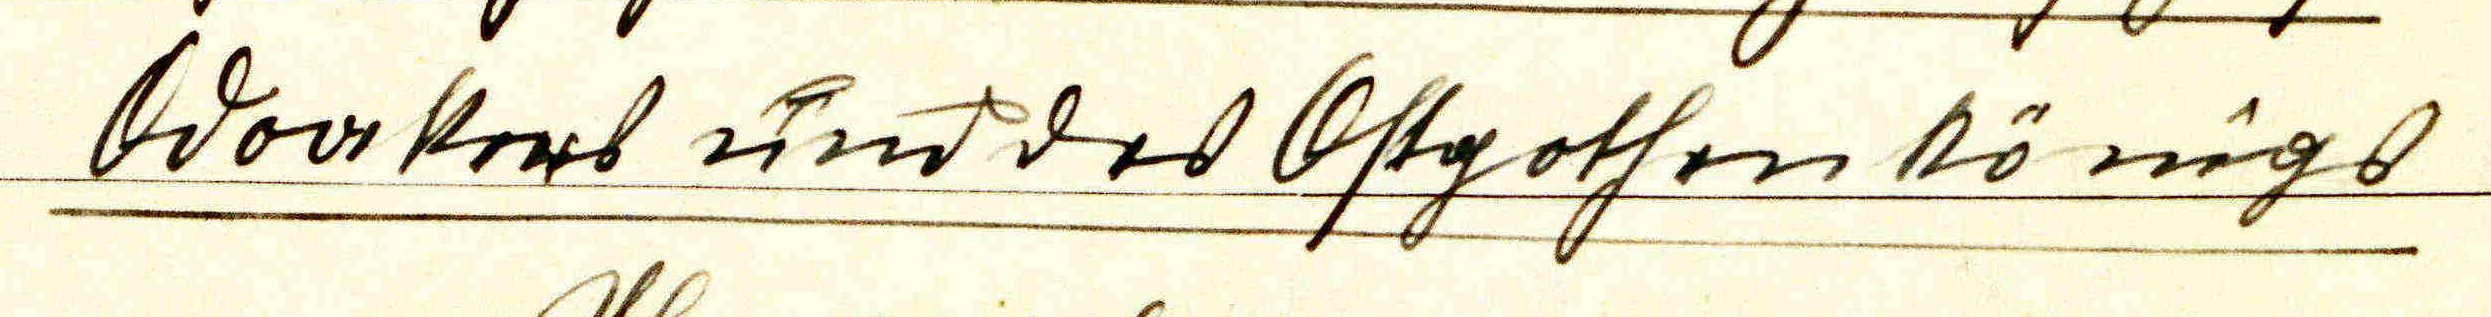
Odoakers und des Ostgothenkönigs
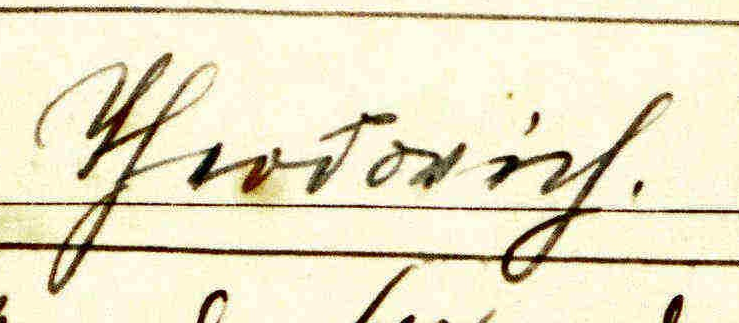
Theodorich.
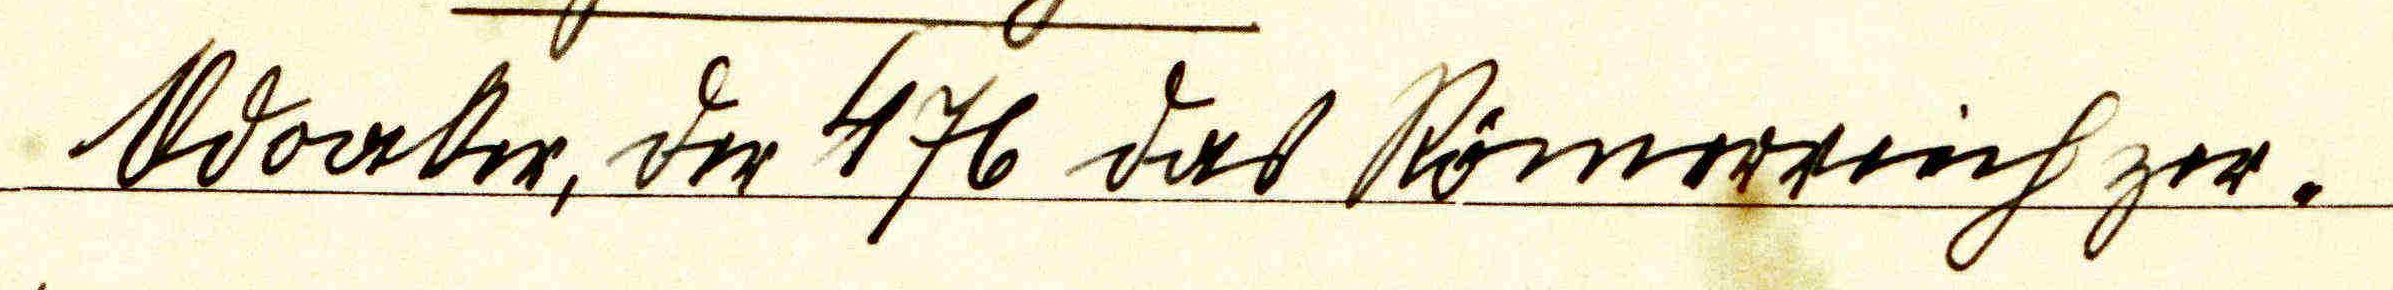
Odoaker, der 476 das Römerreich zer-
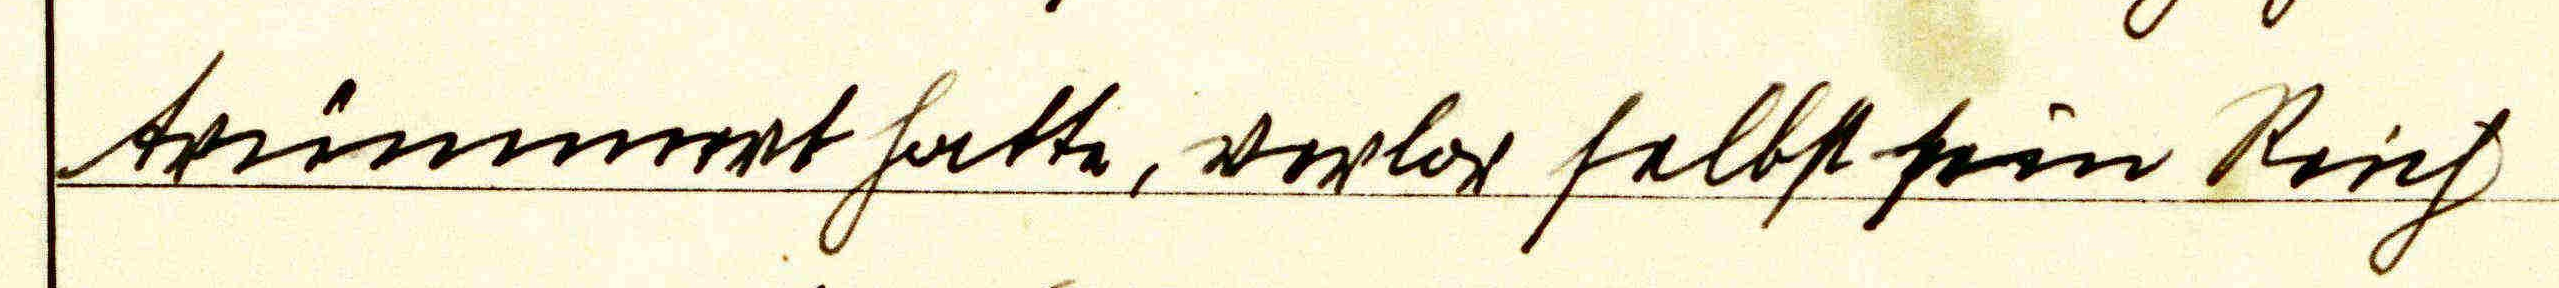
trümmert hatte, verlor selbst sein Reich
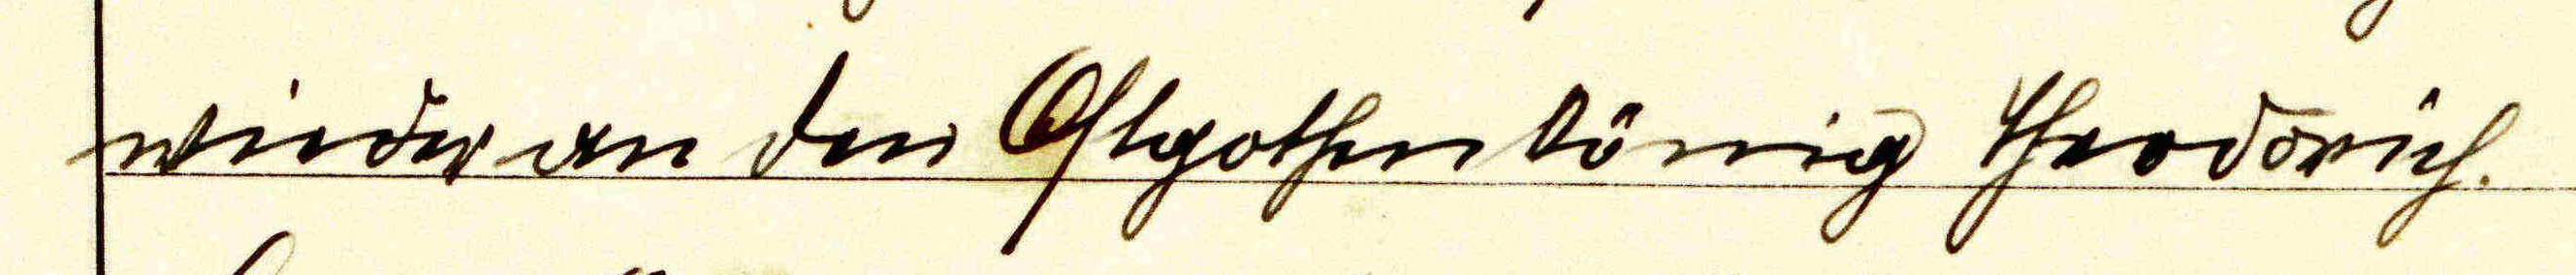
wieder an den Ostgothenkönig Theodorich.
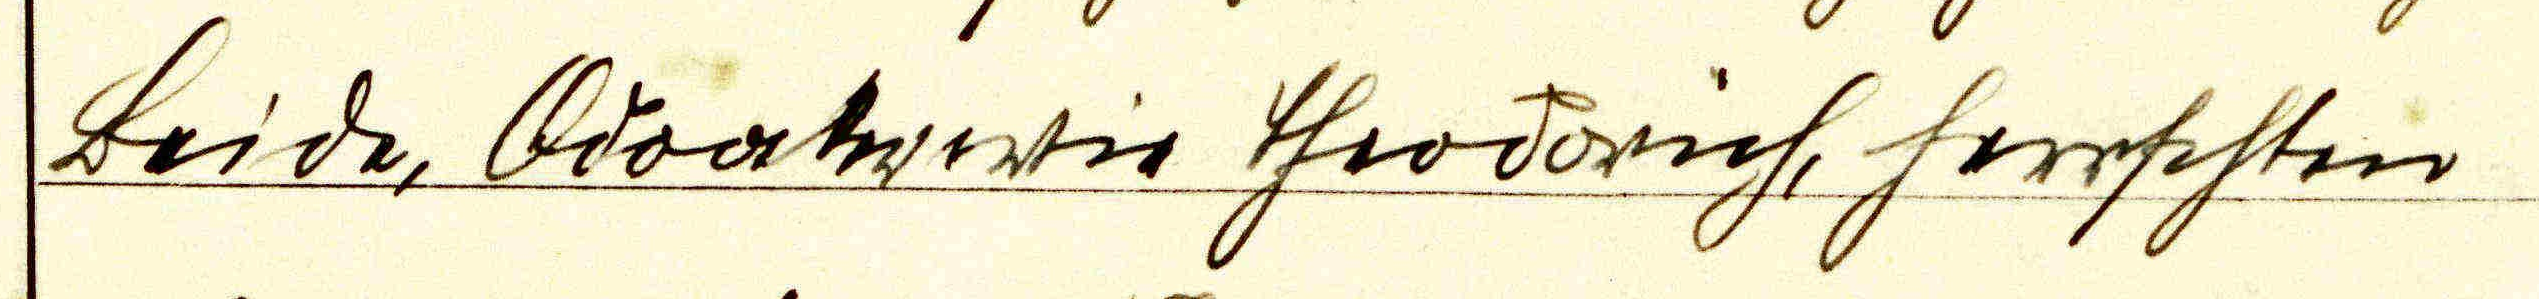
Beide, Odoaker wie Theodorich, herrschten
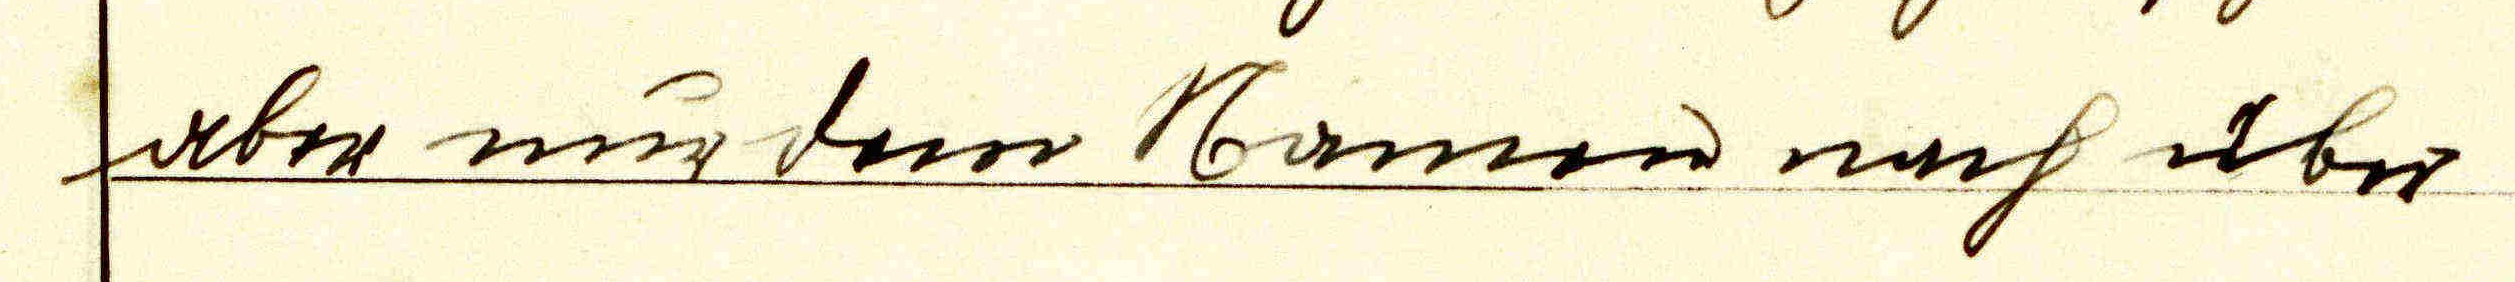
aber nur dem Namen nach über
